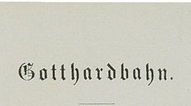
Gotthardbahn.
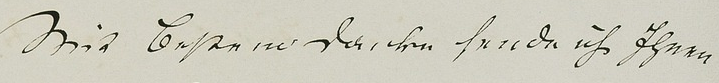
Mit bestem Danke sende ich Ihnen
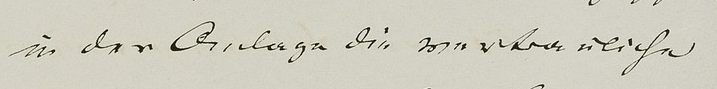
in der Anlage die vertrauliche
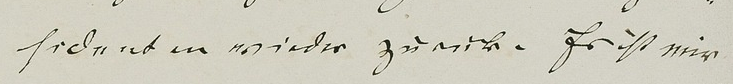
sidenten wieder zurük. Es ist mir
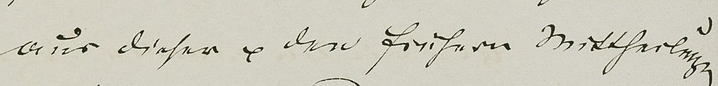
aus dieser & den frühern Mittheilungen
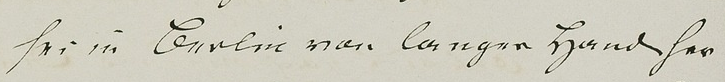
sei in Berlin von langer Hand her
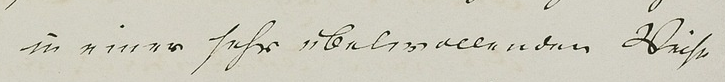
in einer sehr übelwollenden Weise
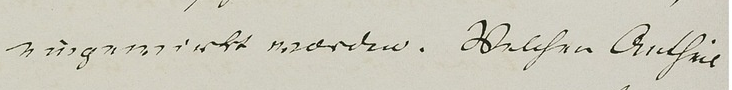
eingewirkt worden. Welchen Antheil
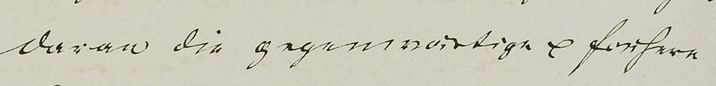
daran die gegenwärtige & frühere
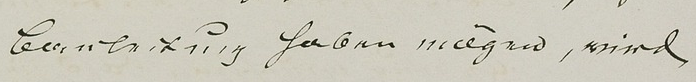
Bauleitung haben mögen, wird
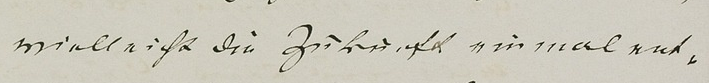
vielleicht die Zukunft einmal ent-
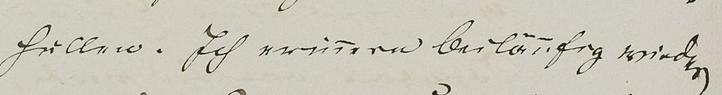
hüllen. Ich erinnere beiläufig wieder
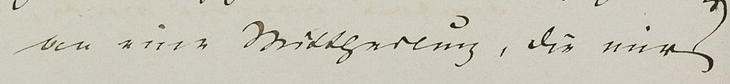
an eine Mittheilung, die mir
